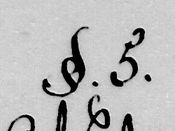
§. 6.
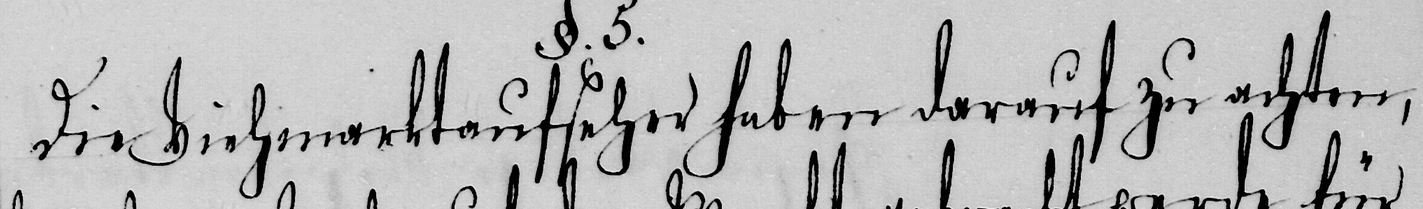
Die Viehmarktaufseher haben darauf zu achten,
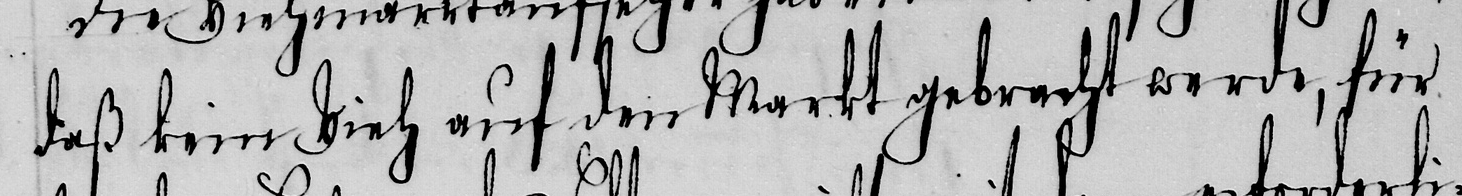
daß kein Vieh auf den Markt gebracht werde, für
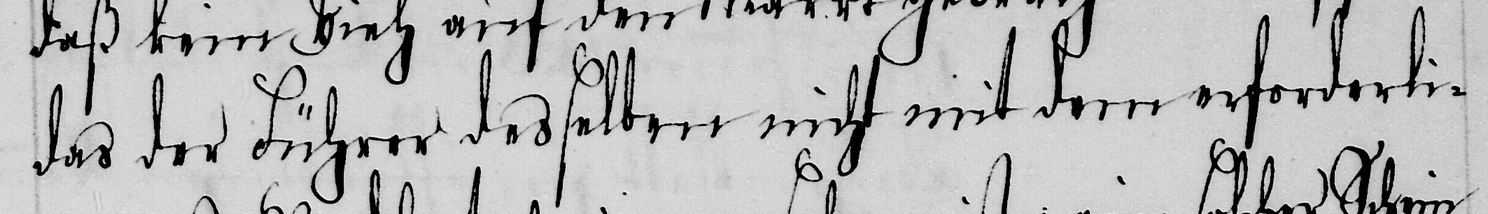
das der Führer desselben nicht mit dem erforderli¬
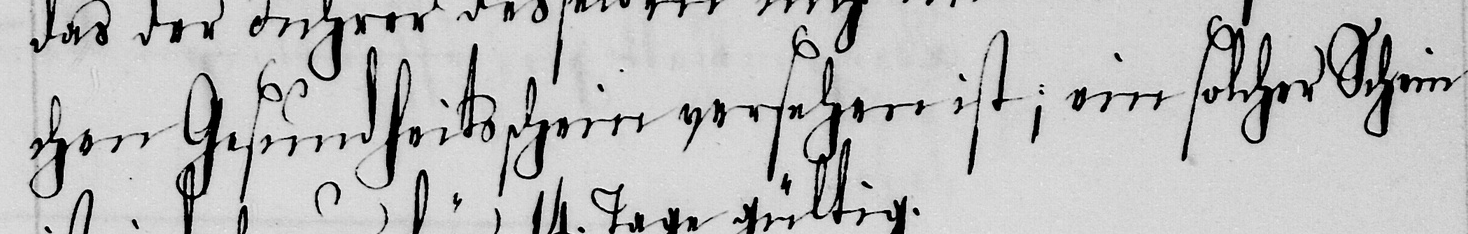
chen Gesundheitsschein versehen ist; ein solcher Sche¬
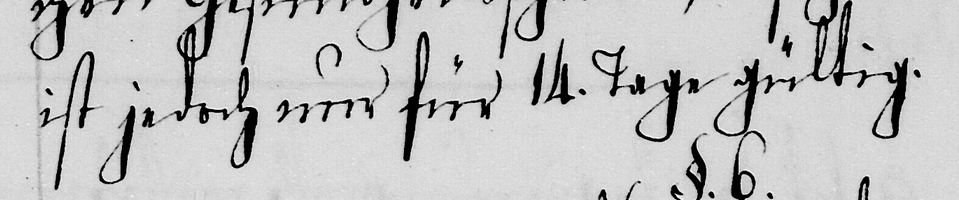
ist jedoch nur für 14. Tage gültig.
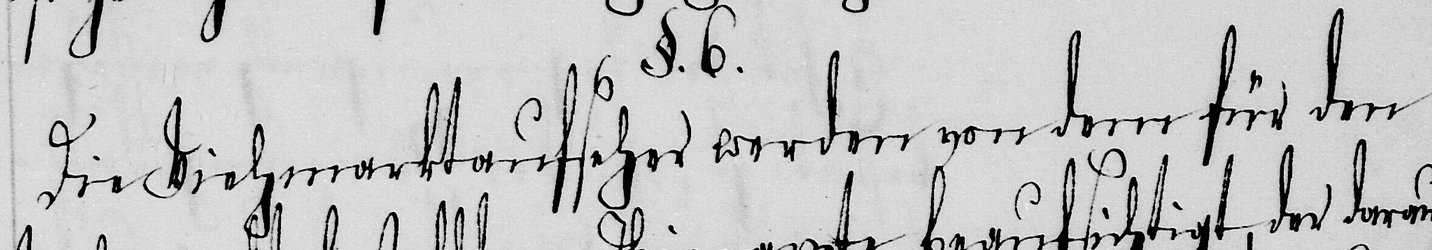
Die Viehmarktsaufseher werden von dem für den
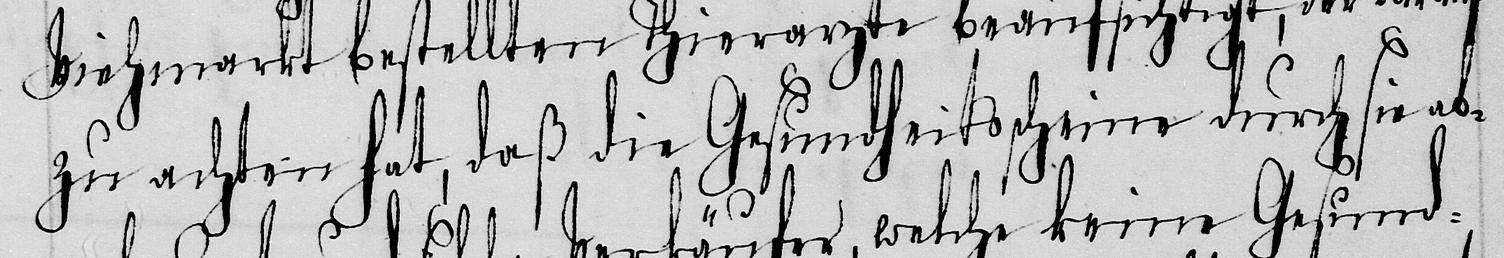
zu achten hat, daß die Gesundheitsscheine durch sie a¬
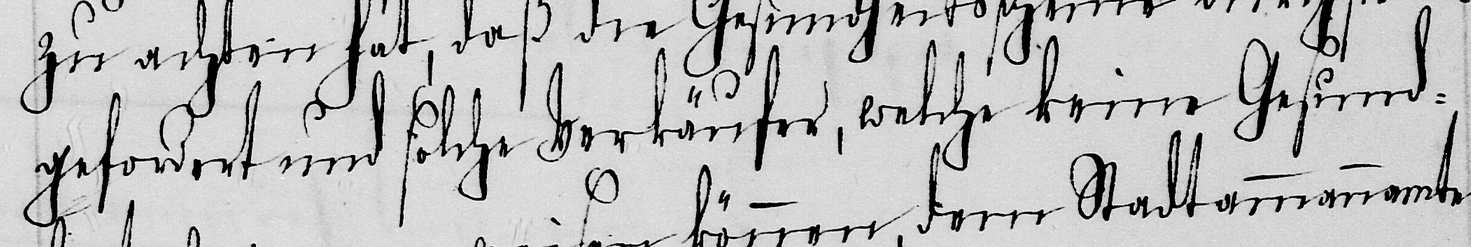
bgefordert und solche Verkäufer, welche keine Gesund¬
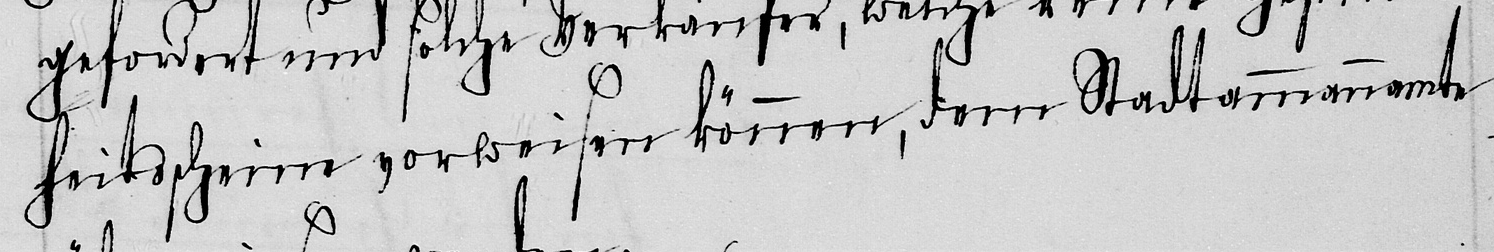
heitsscheine vorweisen können, dem Stadtammannamte
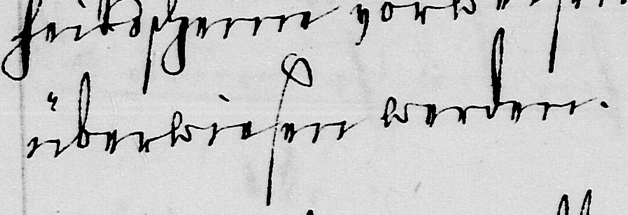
überwiesen werden.
